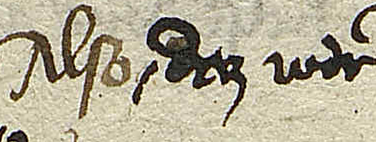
Alſo / daʒ wir
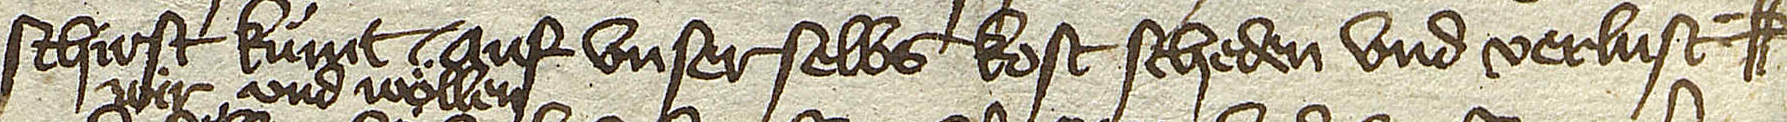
ſchirſt kümt / . auf vnſer ſelbs koſt ſcheden vnd verluſt
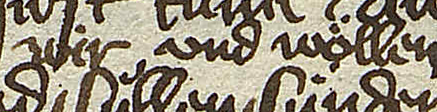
wir vnd wöllen
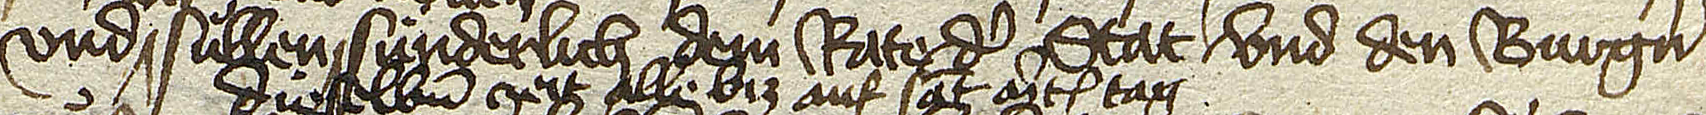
vnd ſüllen ſünderlich dem Rate d* Stat / vnd den Burgn*
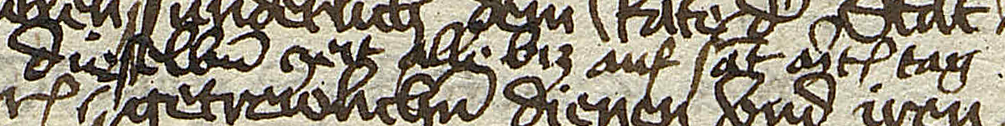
dieſelbn* cʒeit alle biʒ auf ſat* Mt* tag
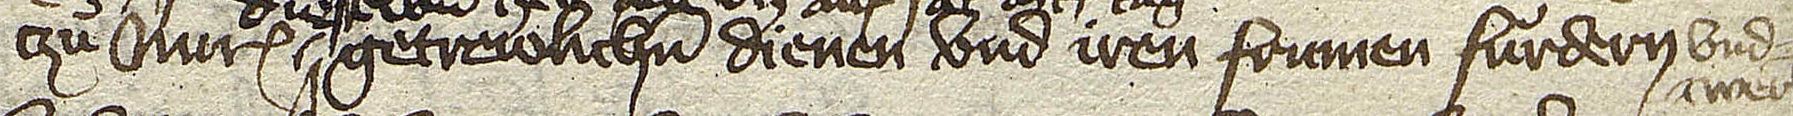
cʒü Nur* getrewlichn* dienen vnd iren frumen fürdern vnd
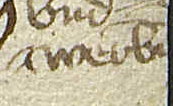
werb%
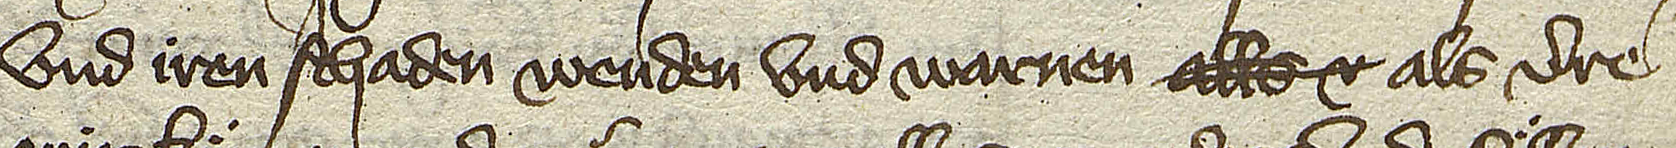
vnd iren ſchaden wenden vnd warnen alls v als v*re
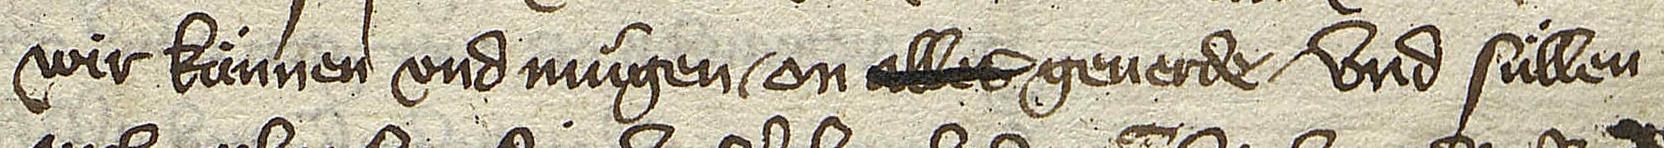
wir künnen vnd mügen / on alles geuerde / vnd ſüllen
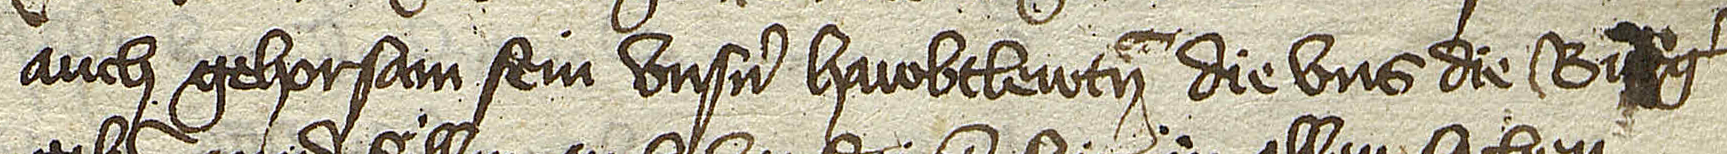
auch gehorſam ſein vnſn* hawbtlewtn* die vns die Burg*
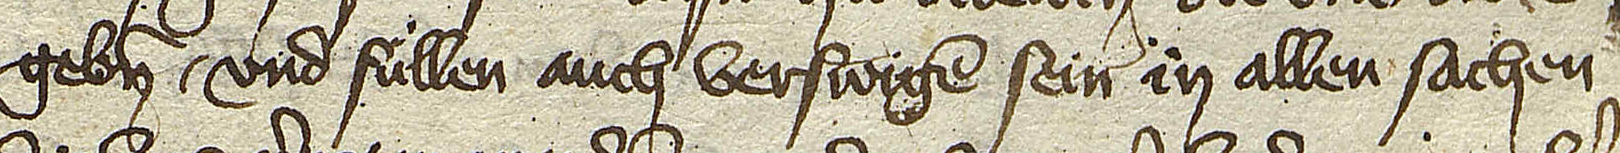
gebn* / vnd ſüllen auch verſwige* ſein in allen ſachen
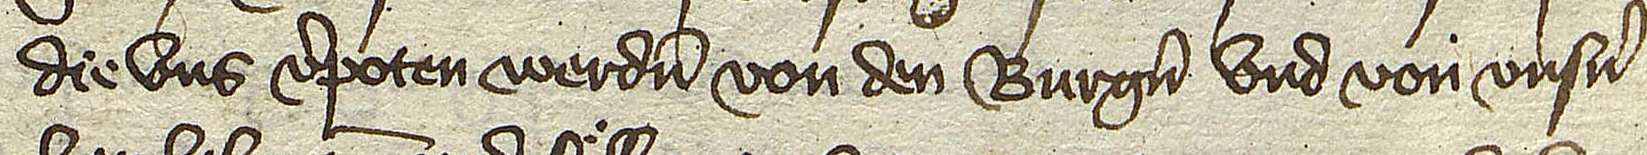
die vns v*poten werdn* von den Burgn* vnd von vnſn*
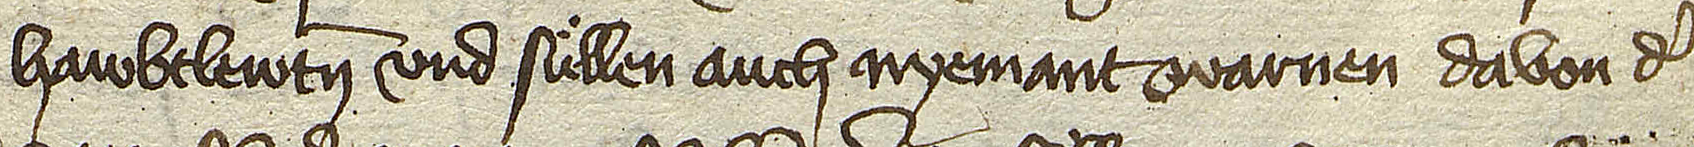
hawbtlewtn* vnd ſüllen auch nyemant warnen davon d*
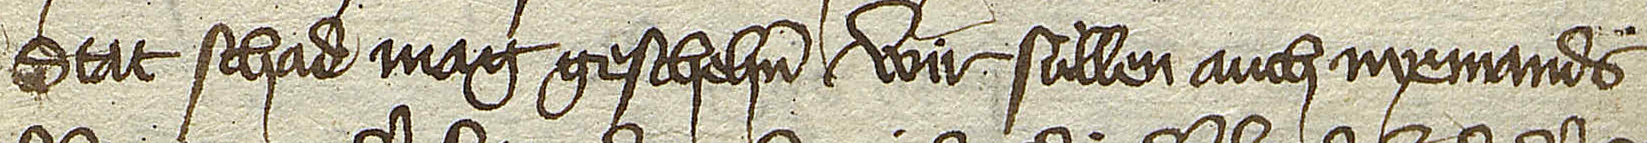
Stat ſchad mag geſchehn* / Wir ſüllen auch nyemands
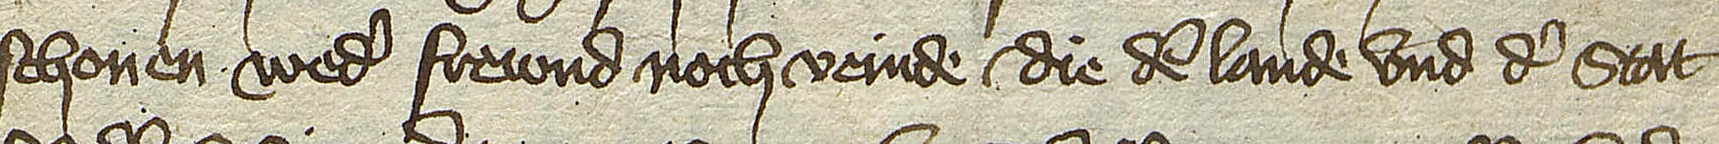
ſchonen wed* frewnd noch veinde / die d* lande vnd d* Stat
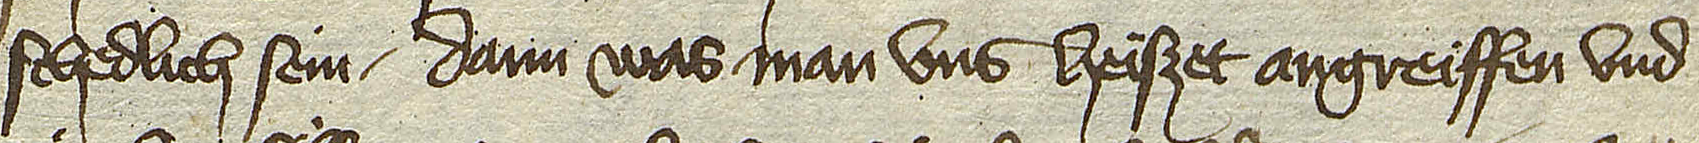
ſchedlich ſein / dann was man vns heiſʒet angreiffen vnd
